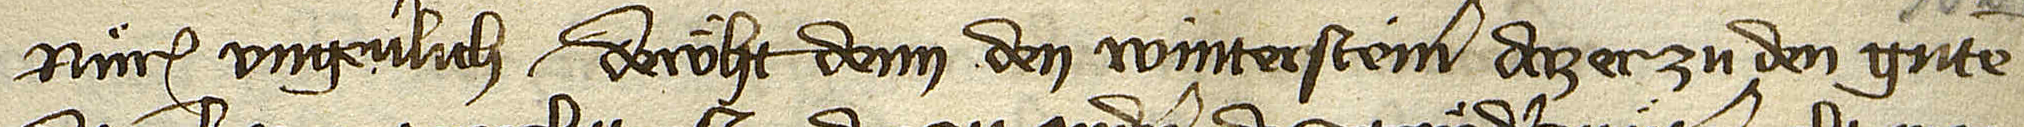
Nür* vngeu*lich / Deẅht denn den winterſtein* daʒ er ʒu den gute*
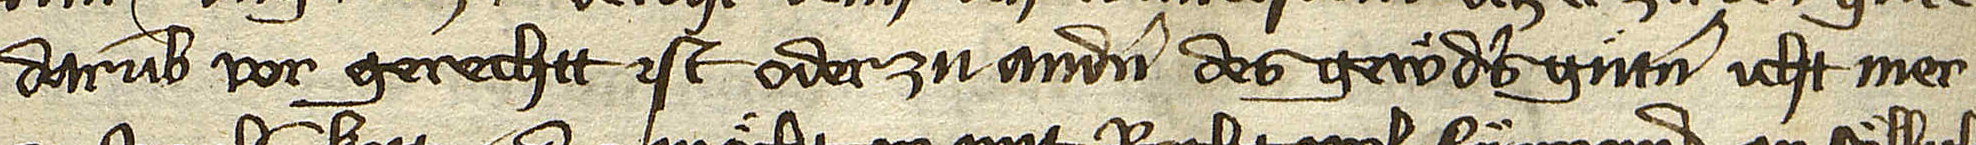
darub* vor gerechtt iſt oder ʒu and*n des geẅd*s güt*n icht mer
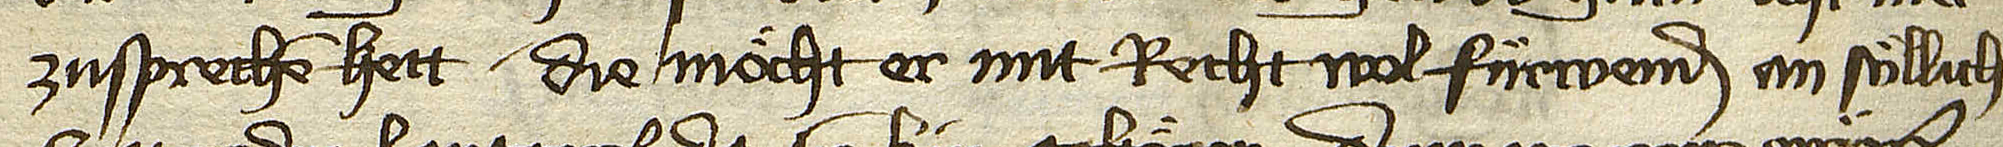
ʒuſpreche* hett / Die möcht er mit Recht wol fürwend* an ſöllich
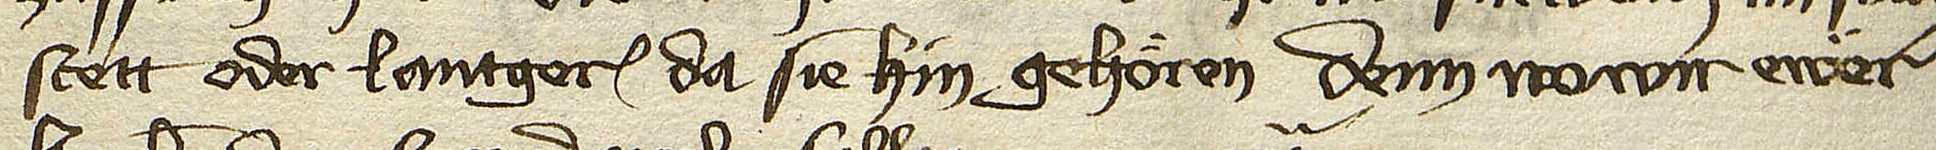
ſtett oder lantger* da ſie hin gehören Denn wo wir ewër*
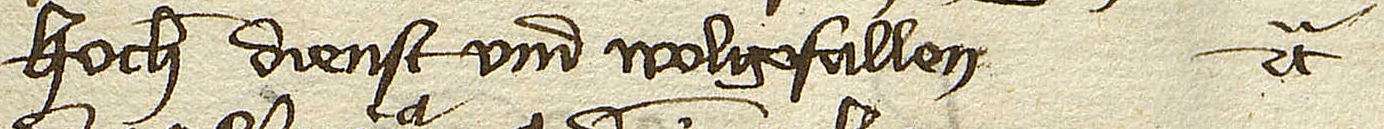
hoch* dienſt vnd wolgefallen ec*
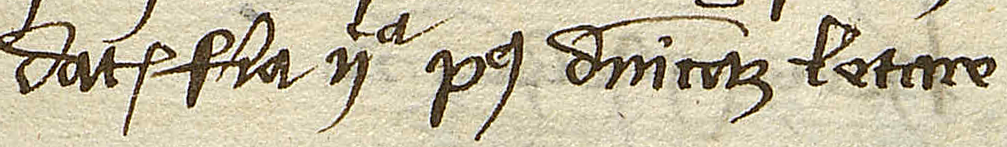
Dat* f*ia ii* p* dnica* letare
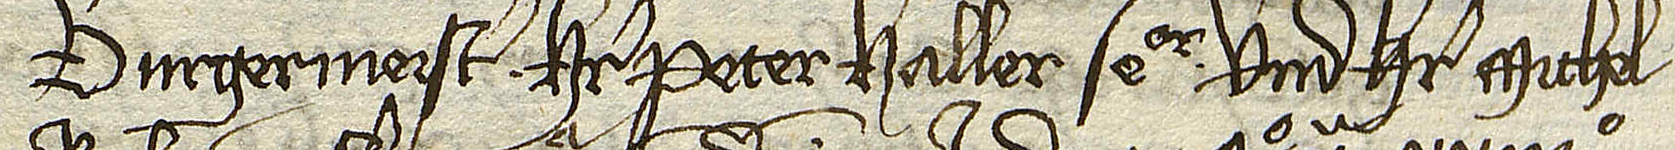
Burgermeiſt* . H*r Peter Haller ſe* . Vnd H*r Michel
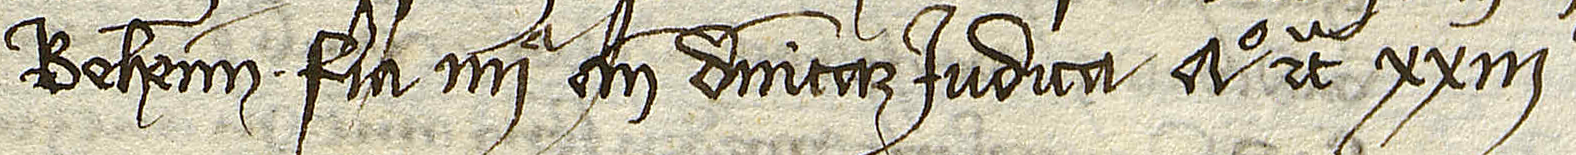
Beheim . f*ia iiii* an* dnica* Iudica A* ec* xxiii*
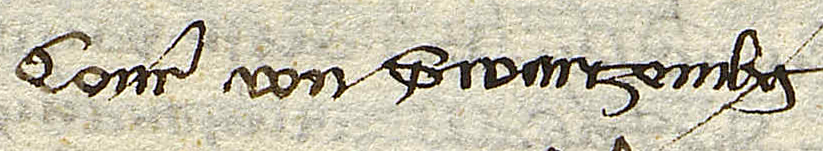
Conr* von Swarcʒemb*g
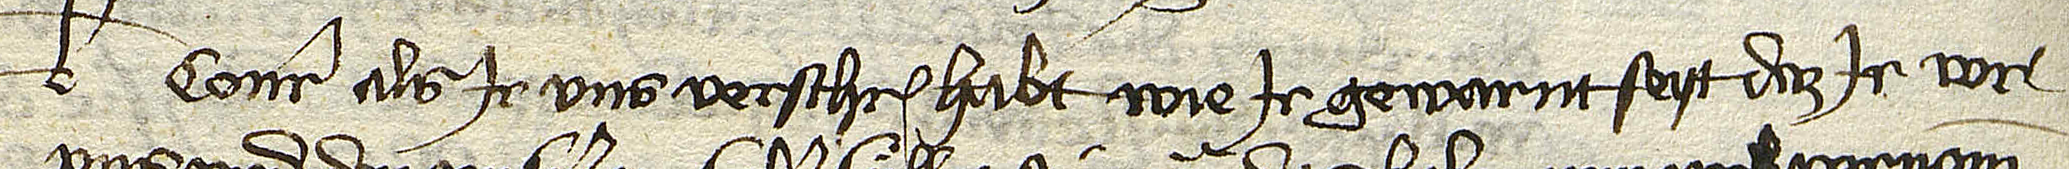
L* Conr* als Ir vns verſchr* habt wie Ir gewarnt ſeyt daʒ Ir vor
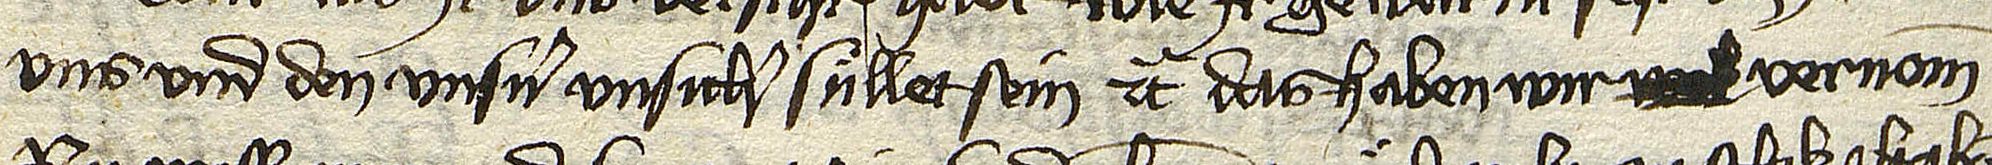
vns vnd den vnſ*n vnſich* ſüllet ſein ec* das haben wir wol vernom*
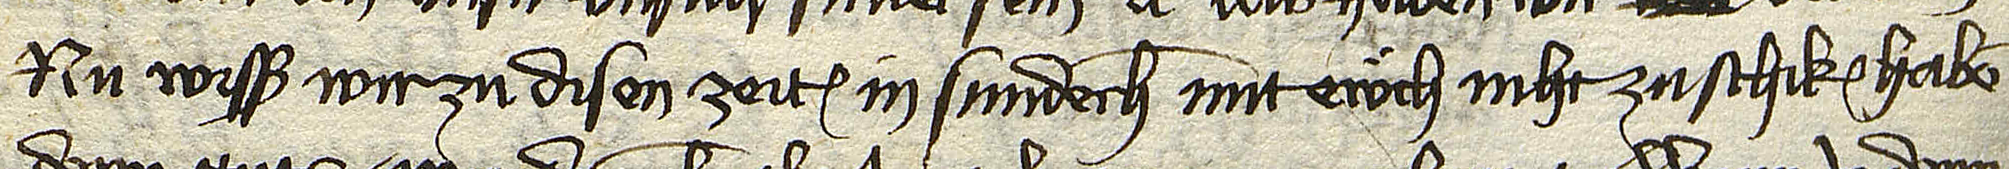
Nu wiſſ* wir ʒu diſen ʒeit* in ſunderh* mit eẅch niht ʒu ſchik* habe*
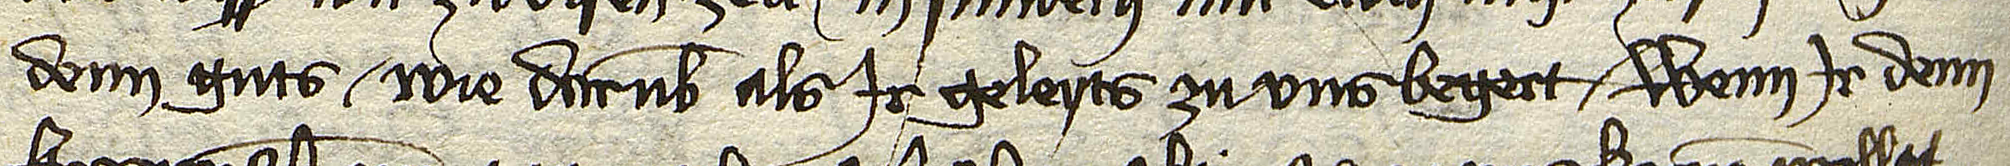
denn guts / wie darub* als Ir geleyts ʒu vns begert / Wenn Ir denn
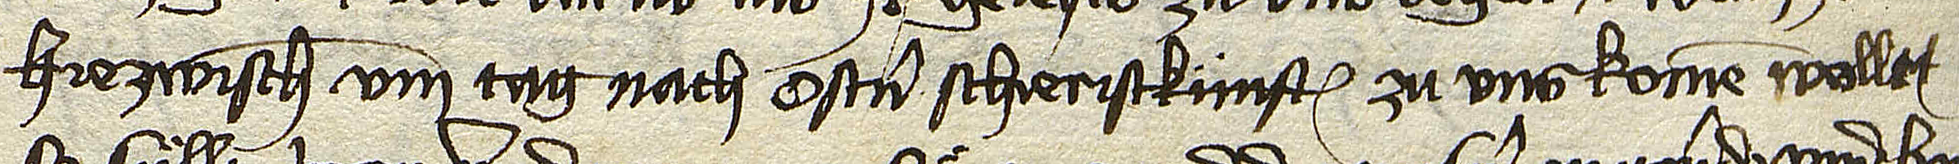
hieʒwiſch* viii tag nach Oſt*n ſchieriſtkünft* ʒu vns kome* wollet
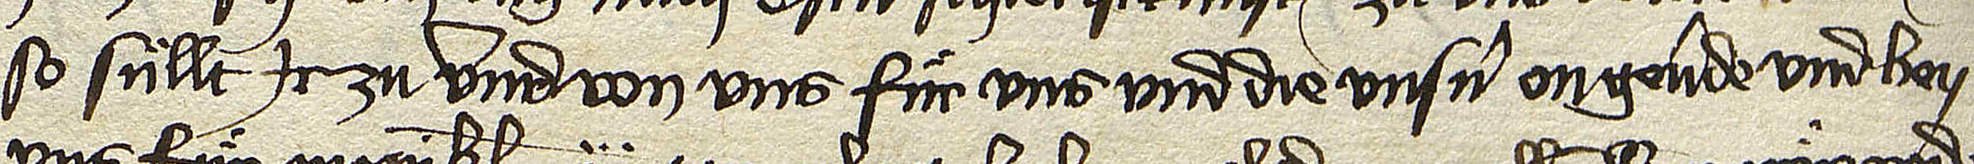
ſo ſüllt Ir ʒu Vnd von vns für vns vnd die vnſ*n on geu*de vnd bey
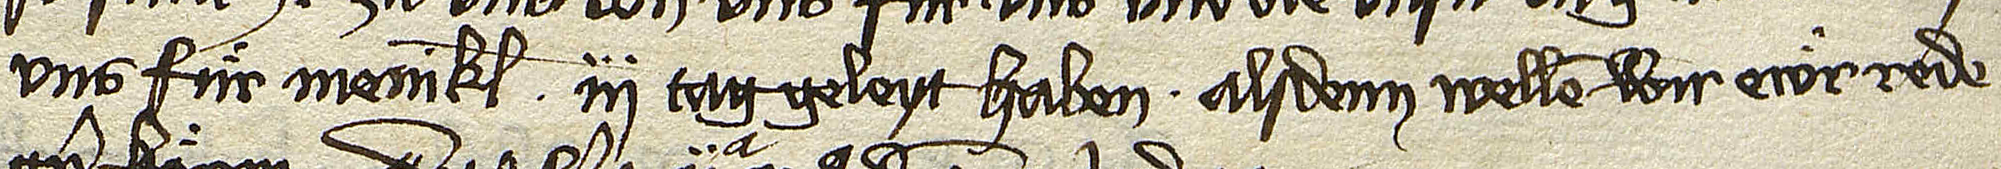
vns für menikl* . iii tag geleyt haben . alſdenn welle* wir eẅr rede
